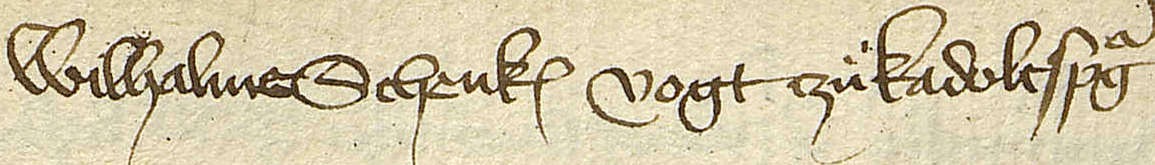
Wilhalm Schenk* vogt cʒü Kadoltſp*g
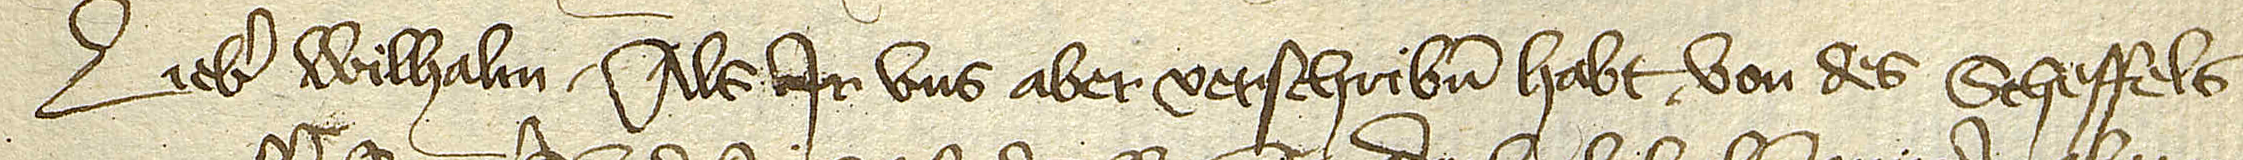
Lieb* Wilhalm / Als Ir vns aber verſchribn* habt / von des Scheffels
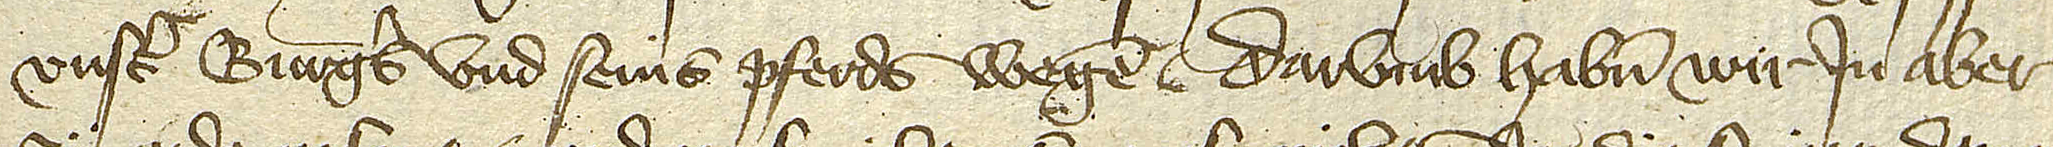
vnſs* Burg*s vnd ſeins pferds wege* / Darvmb habn* wir In aber
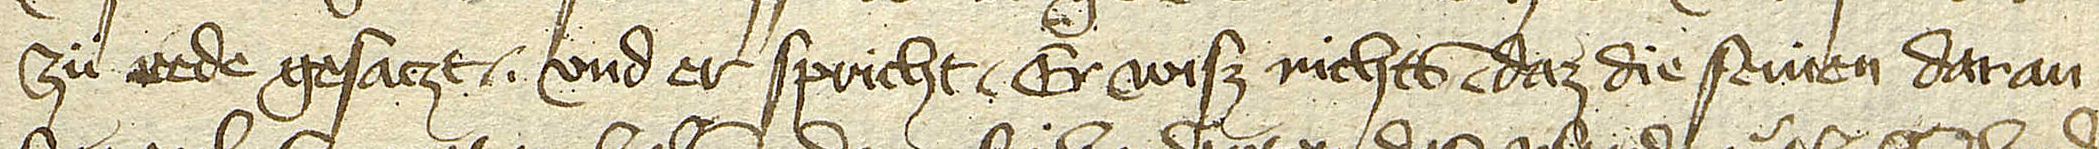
cʒü rede geſacʒt / . vnd er ſpricht / Er wiſʒ nichts / daʒ die ſeinen daran
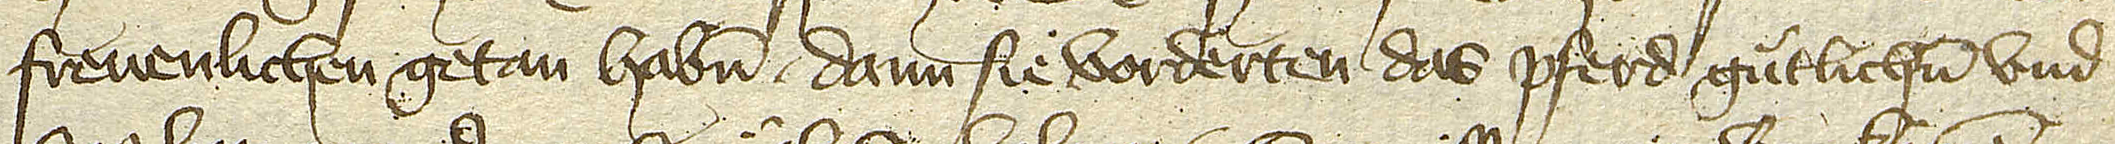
frewenlichen getan habn* / dann ſie vorderten das pfers gütlichn* vnd
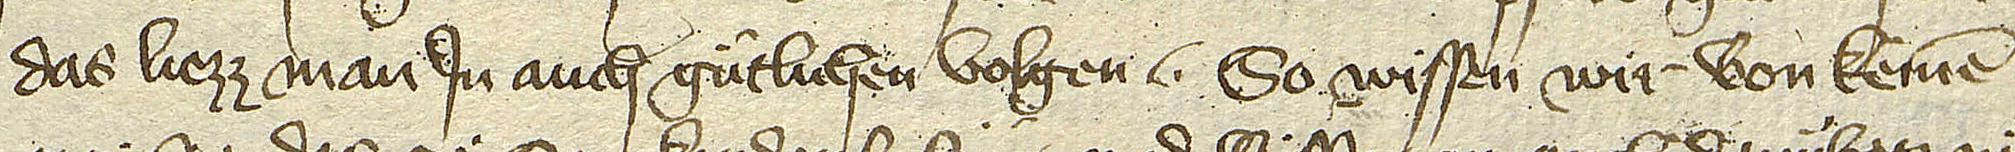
das lieʒʒ man In auch gütlichen volgen / . So wiſſen wir von keine*
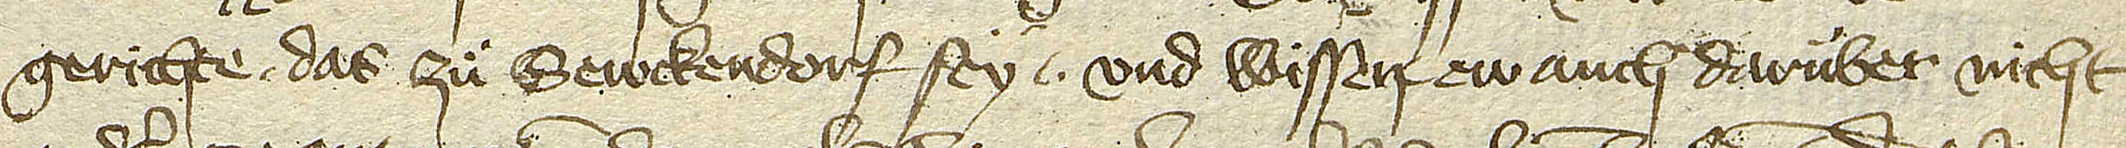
gerichte / daʒ cʒü Sewckendorf ſey / . vnd wiſſen ew auch darüber nicht
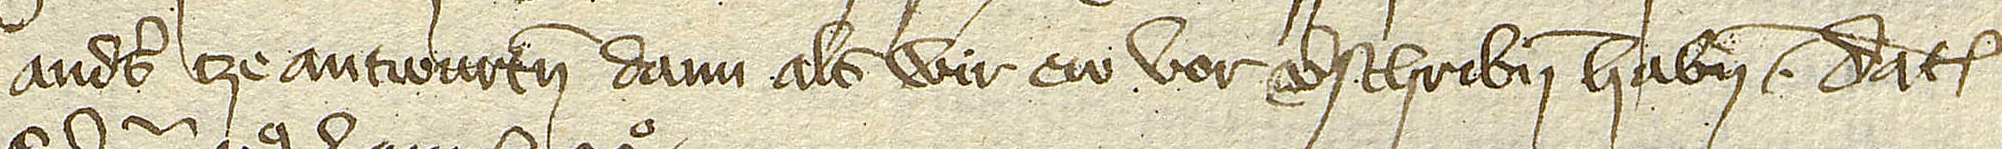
ands* cʒe antwurtn* dann als wir ew vor v*ſchribn* habn* /. dat*
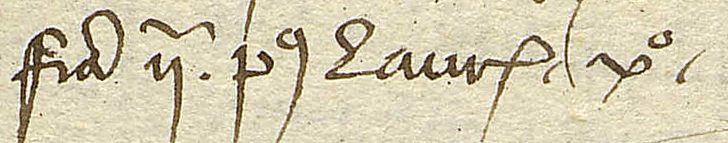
fia* ii*. p* Laur* / x* /
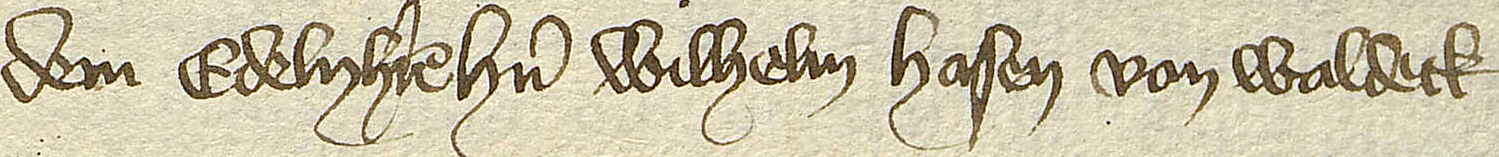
Dem Edelnh*re* hn* Wilhelm haſen von Waldeck
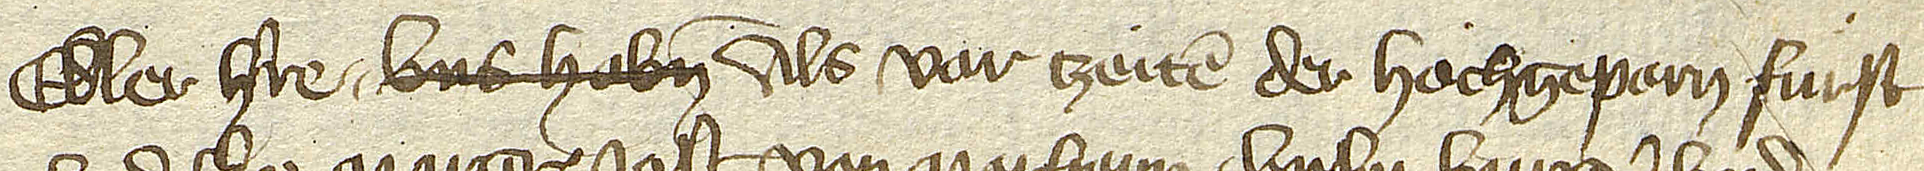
Edler h*re / Vns habn* Als wir cʒeite* der hochgeporn fürſt
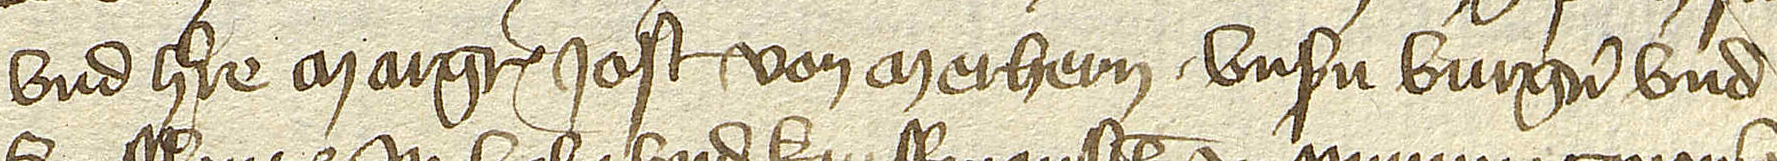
vnd h*re Margr* Ioſt von Merhern / vnſ*n burgn* vnd
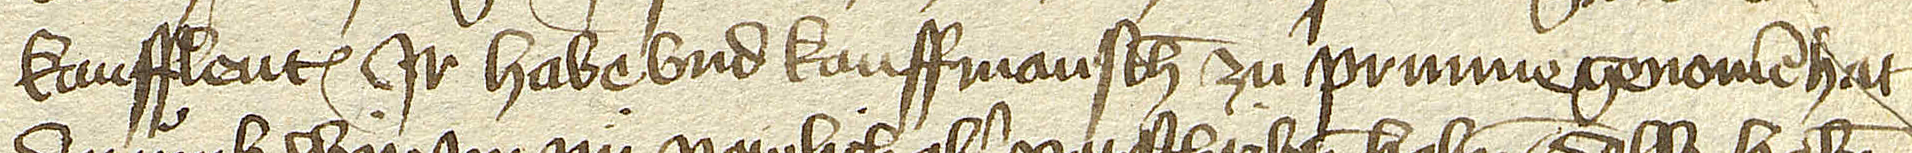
kauffleut* Ir habe vnd kauffmanſch* cʒu Prunne genome* hat
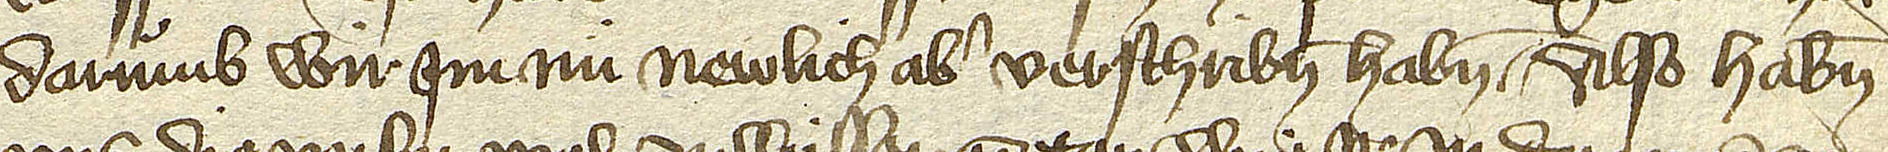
darümb wir Im nü newlich ab* verſchribn* habn* / Alſo habn*
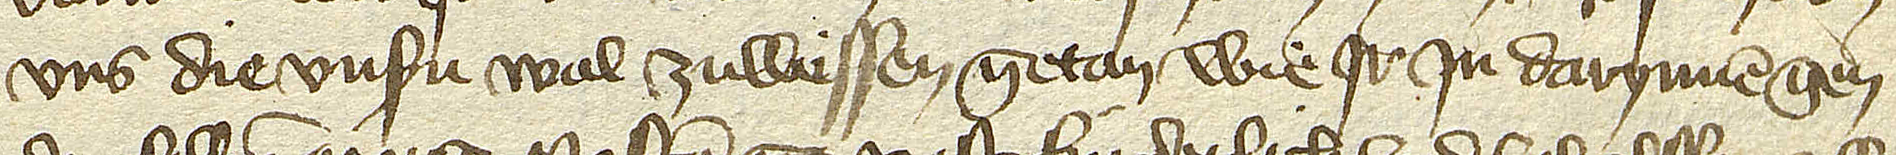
vns die vnſ*n wol cʒuwiſſen getan / wie Ir In darynne* gen
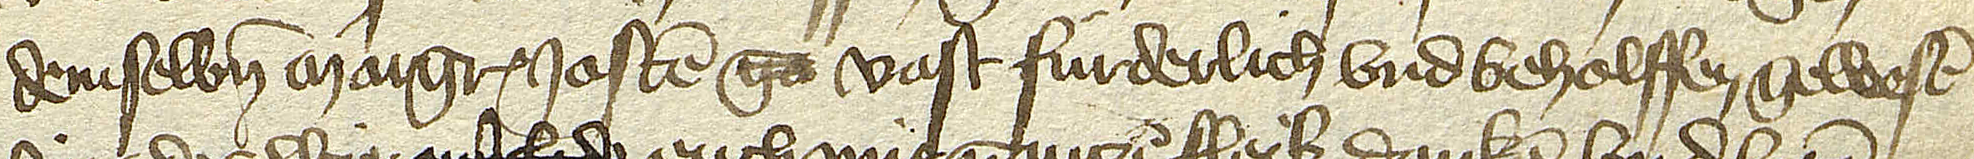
demſelbn* Margr* Ioſte* ge vaſt fürderlich vnd beholffen geweſe*
